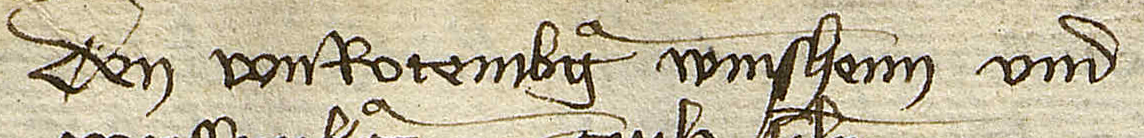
Den von Rotemb*g winſheim vnd
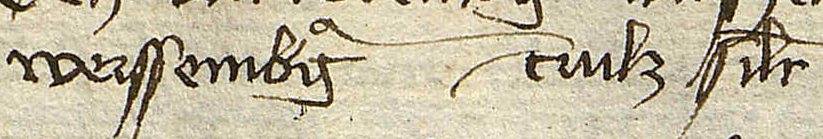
weiſſemb*g / cuil* ſilr*
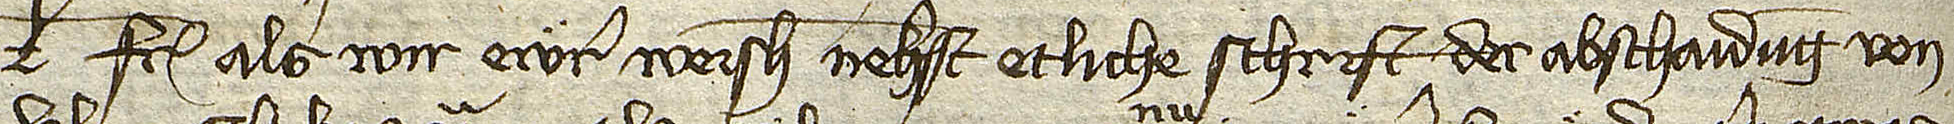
L* fr* als wir eẅr* weiſh* nehſt etliche ſchrift der abſchaid*ug von
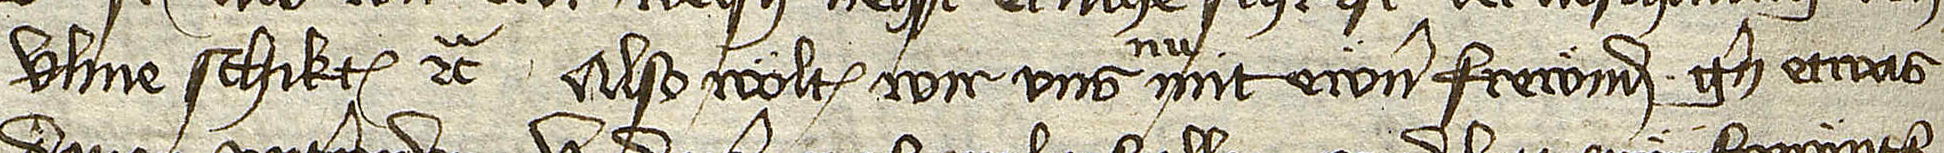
Vlme ſchikt* ec* Alſo wölt* wir vns mit eẅn* freẅnd* . g*n etwas
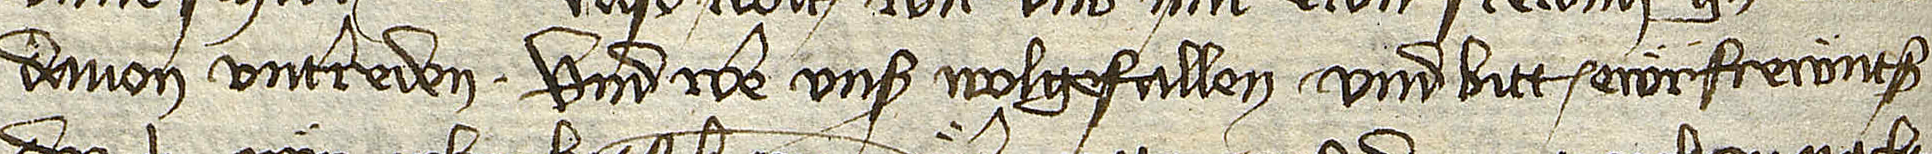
dauon vnt*reden . Vnd we* vnſ* wolgefallen / vnd bitt* eẅr freẅntſ*
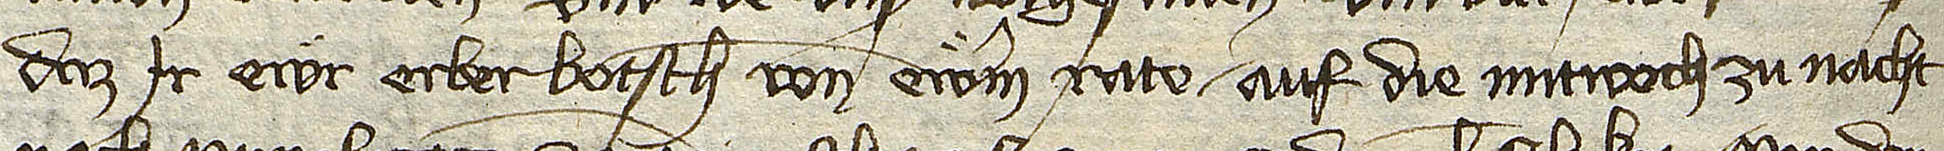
daʒ Ir eẅr erber botſch* von eẅ*m rate / auf die mitwoch ʒu nacht
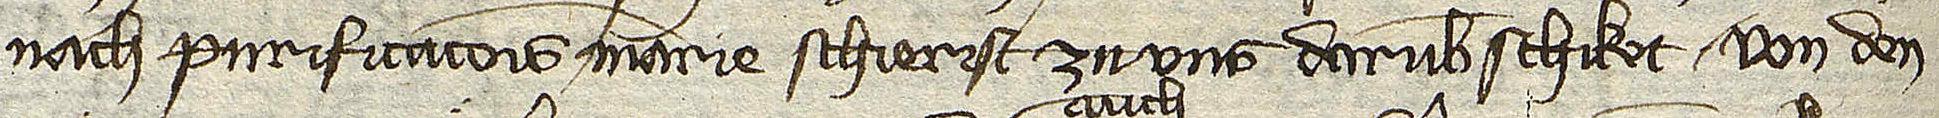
nach purificacois* marie ſchieriſt ʒu vns darub* ſchiket / von den
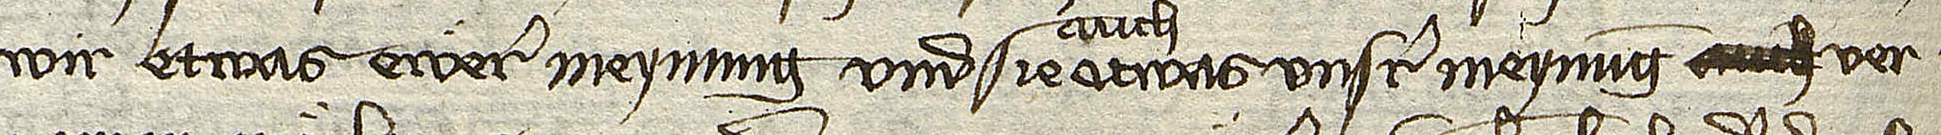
wir etwas eẅer* meynung vnd ſie etwas vnſ*r meynu*g auch ver =
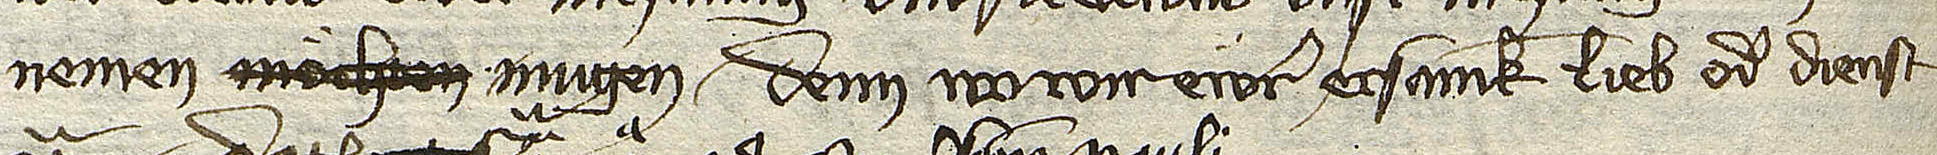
nemen möchten mugen / Denn wo wir eẅr* erſamk* lieb od* dienſt
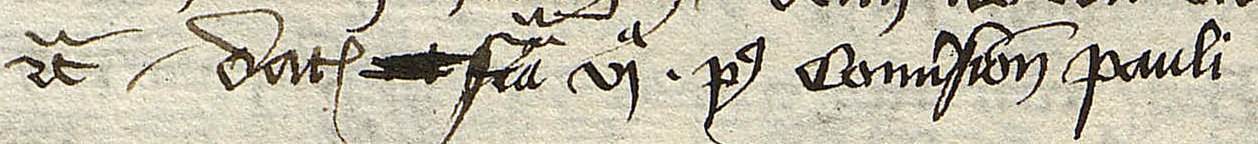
ec* / Dat* ut f*ia vi* . p* Conu*ſion* pauli
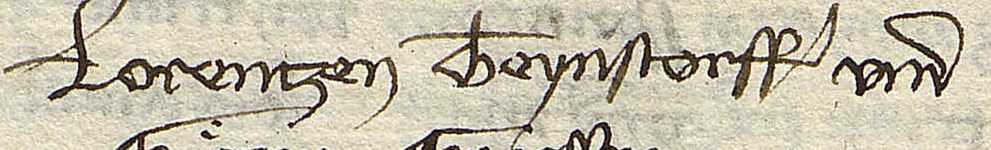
Lorencʒen Teynſtorff* vnd
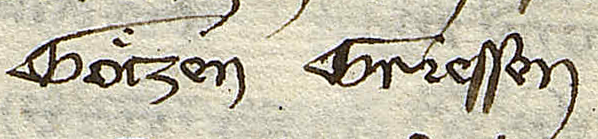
Göcʒen Grieſſen
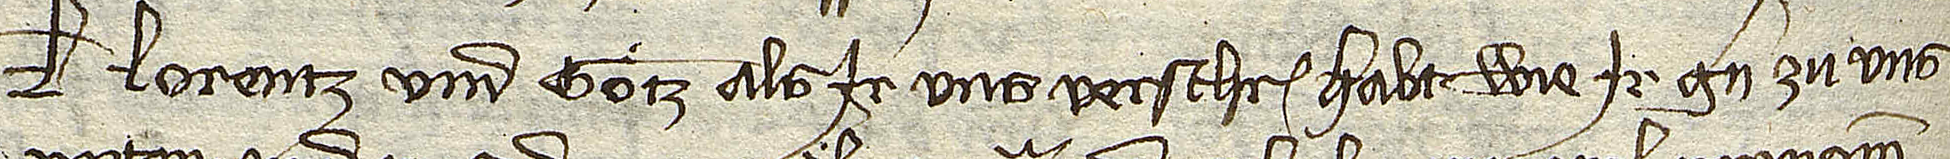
L* lorencʒ vnd Göcʒ als Ir vns verſchr* habt wie Ir g*n ʒu vns
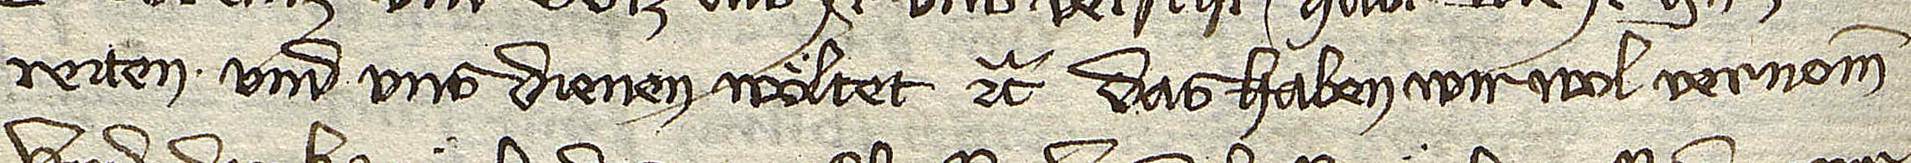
reiten . vnd vns dienen wöltet ec* Das haben wir wol vernom*
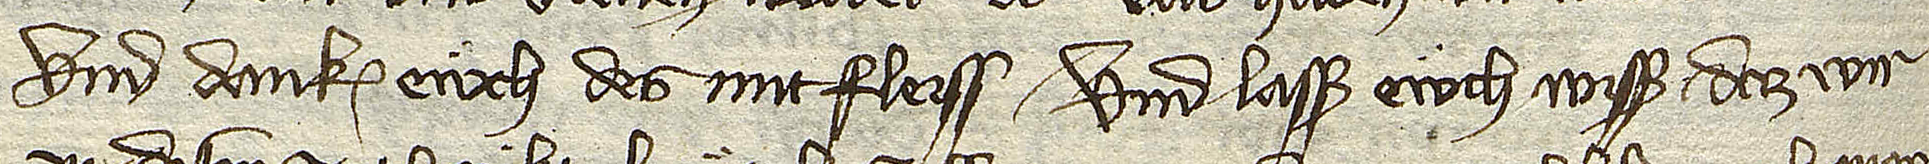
Vnd dank* eẅch des mit fleiſſ / Vnd laſſ* eẅch wiſſ* / daʒ wir
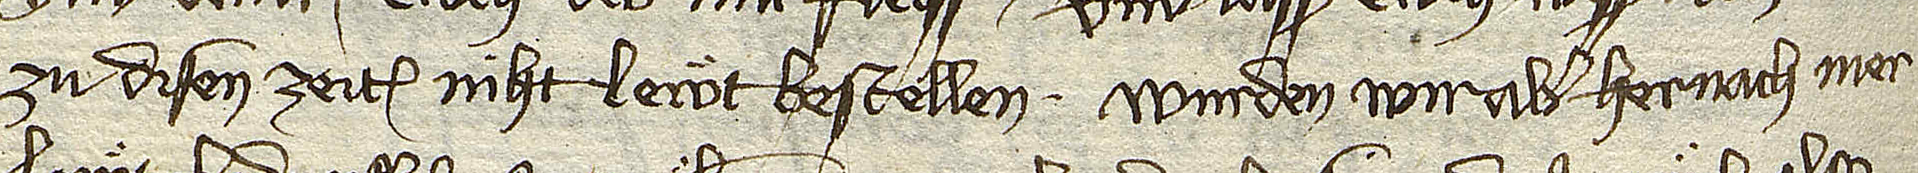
ʒu diſen ʒeit* niht leẅt beſtellen . wurden wir ab* hernach mer
